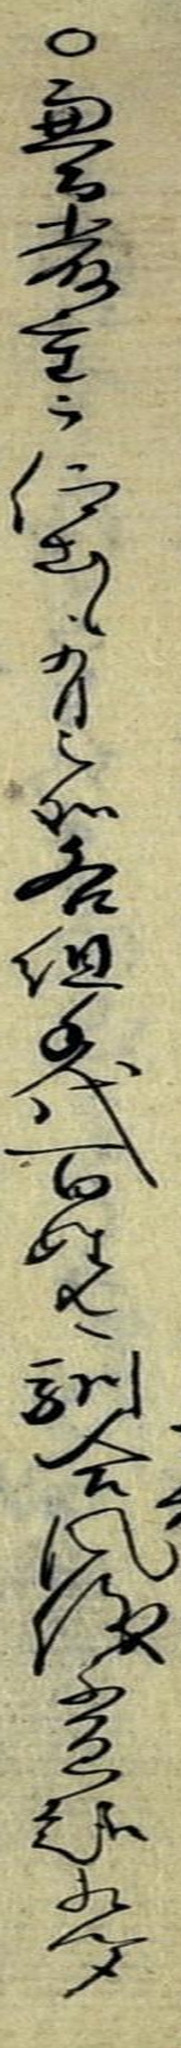〇兼而厳重被仰出も有之処各組手代百姓共へ馴合風儀不宜趣相聞
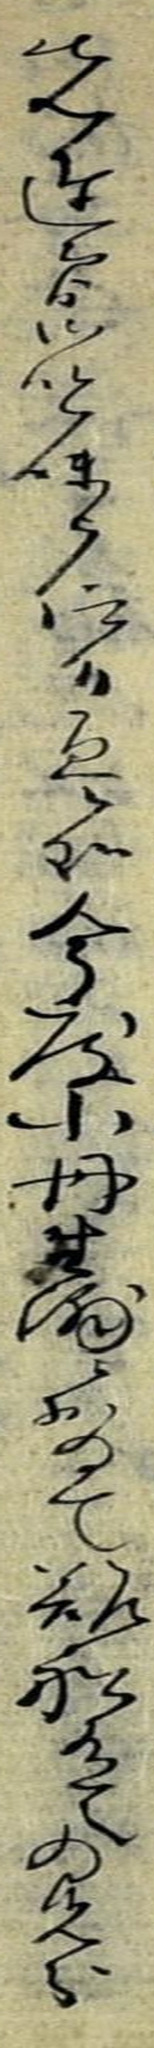先達而ゟ御吟味被仰付置候処今度小丹生浦ニおゐて難船有之為見分
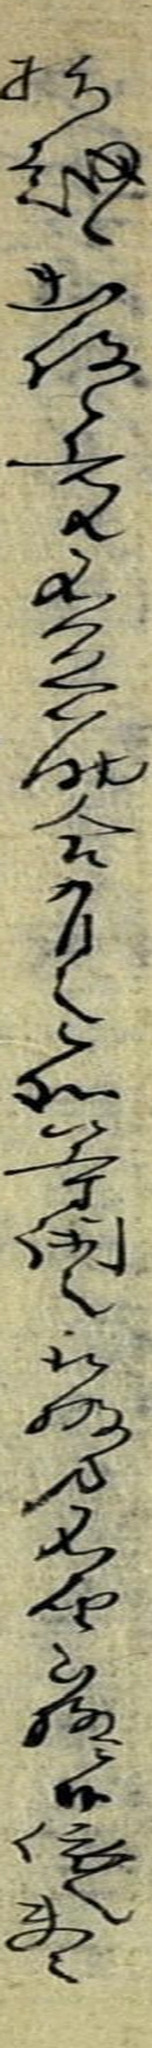指越候出役之者共不宜筋合有之候処等閑之取扱方不届至極ニ候依之夫々
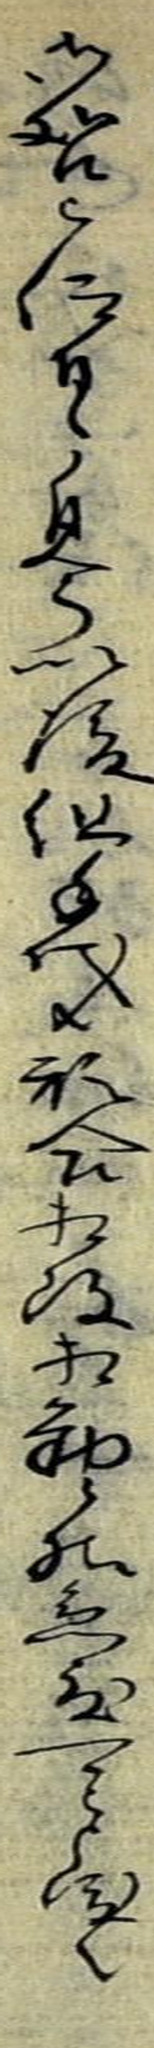御咎被仰付候事自今以後組手代共形合相改相勤候様急度可被申渡候
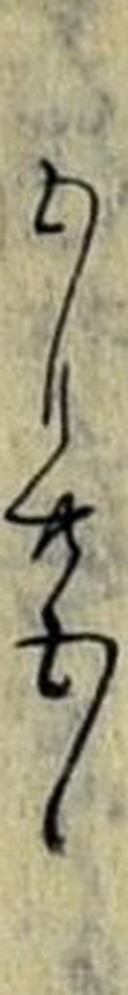五月廿五日
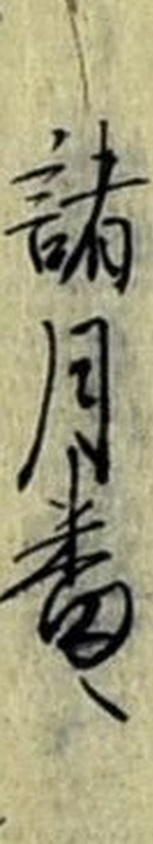諸月番へ
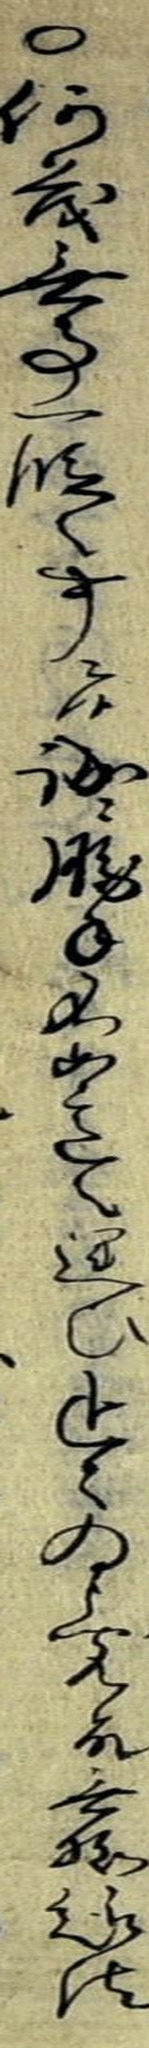〇何茂無事一段之事ニ候誠ニ勝手不如意之運ひ追々為申聞候故無拠趣法
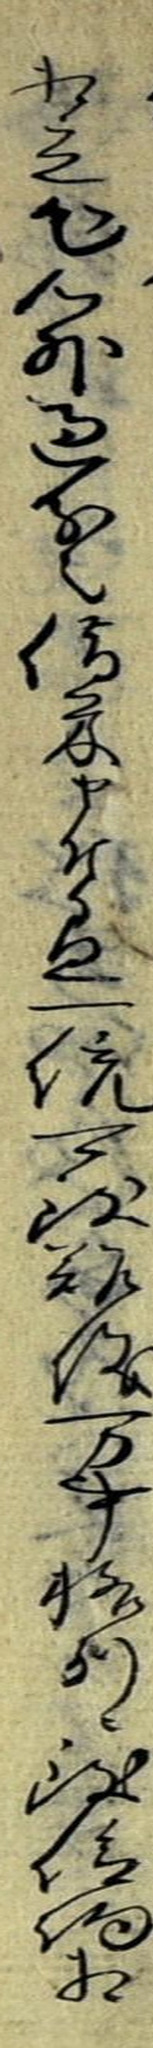相立乍心外過分之借米申付置一統可致難儀万事格別ニ致倹約相

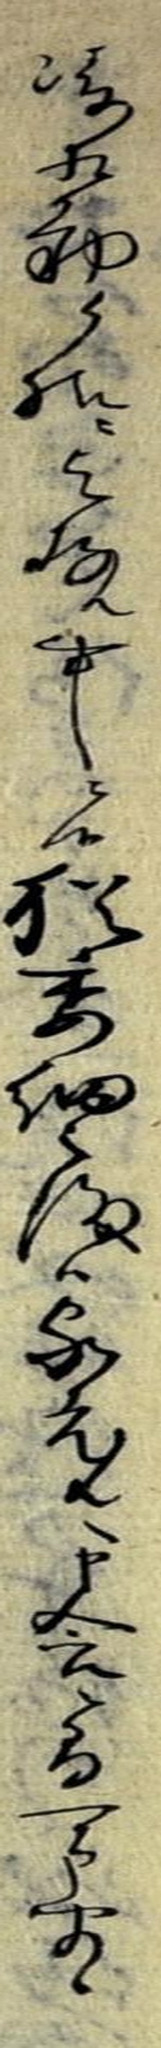凌相勤候様ニ与存ル事ニ候猶委細之儀ハ家老共へ申含候間可申聞候
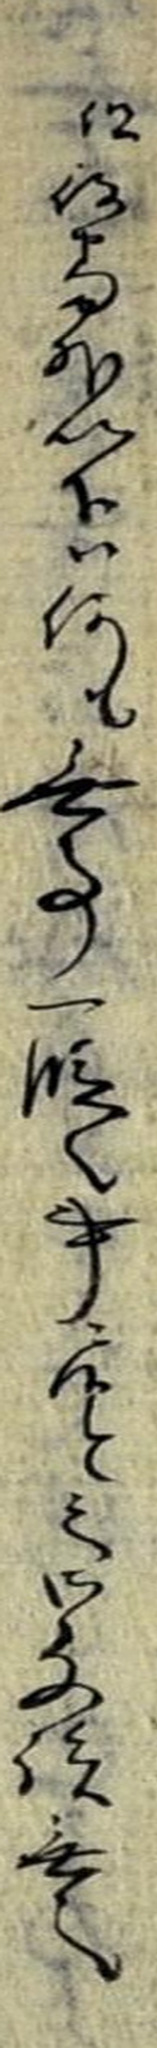但役番外以下ハ何も無事一段之事ニ候と之御文談無之
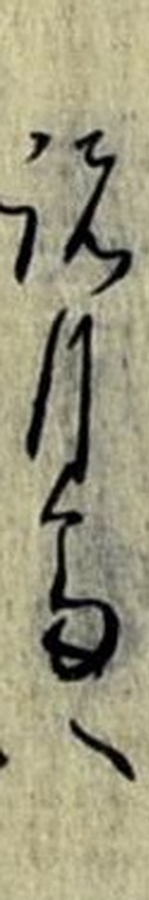諸月番へ
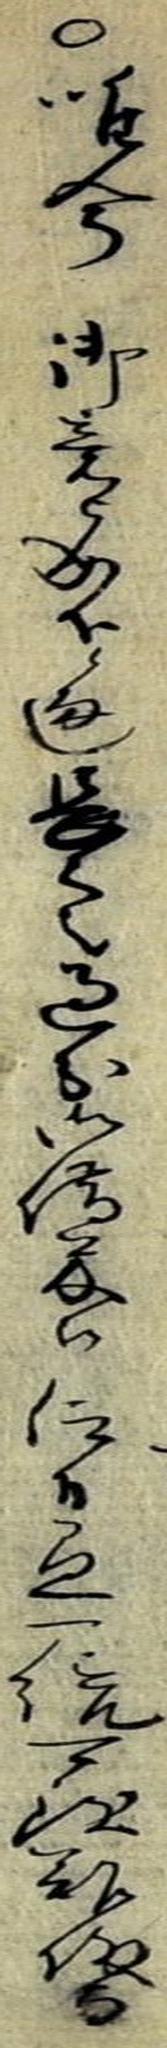〇唯今御意被成下候通長く之過分御借米被仰付置一統可致難儀与
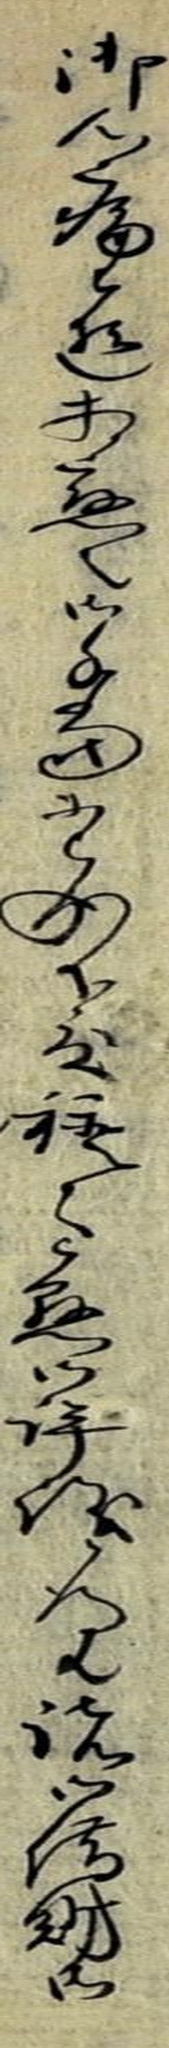御心痛被遊相応之御手当等被成下度種々被懸御評議候得共諸御借財御
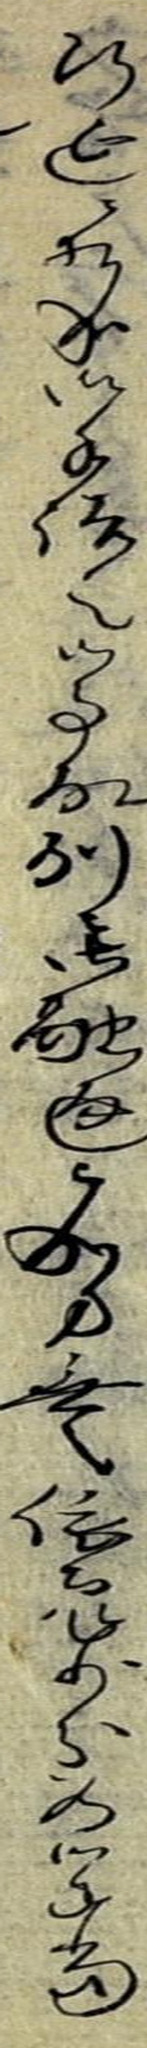断延ニ相成御手詰之御事故別ニ御融通被成方無之依而乍少分為御手当
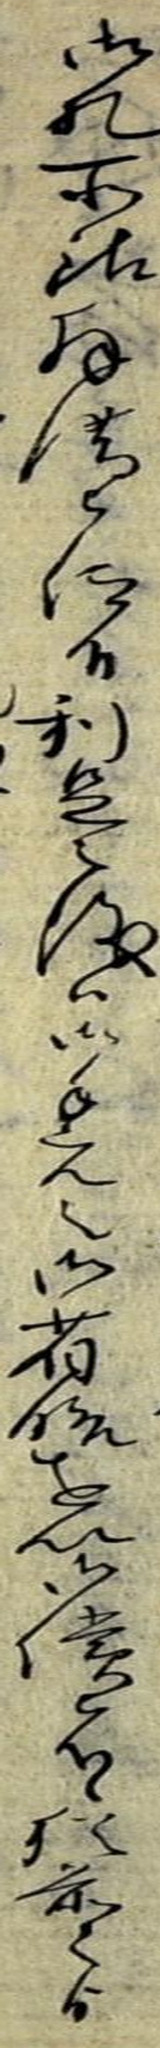御札所銀拝借被仰付利足之儀ハ御手元之御省略を以御償被下候猶前々ゟ
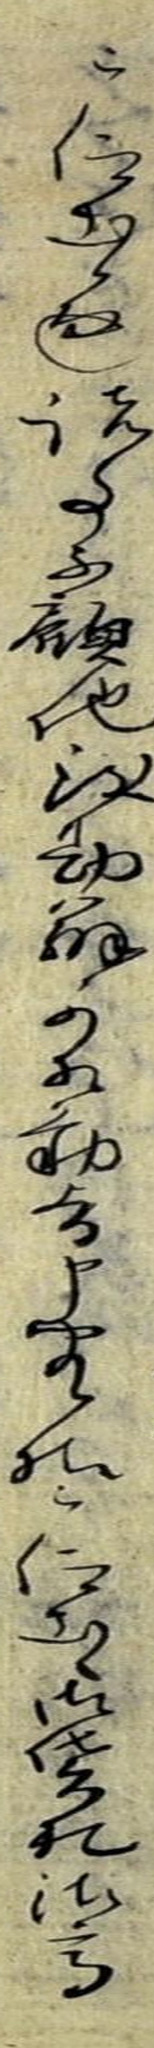被仰出候通諸事不顧他致勘弁可相勤旨申聞候様被仰出候御貸札御高
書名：命令之部 三
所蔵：福井県文書館 Fukui Prefectural Archives
